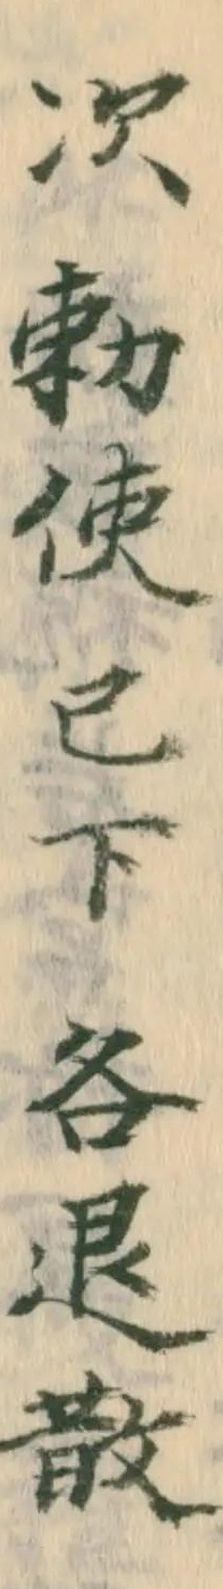次勅使已下各退散
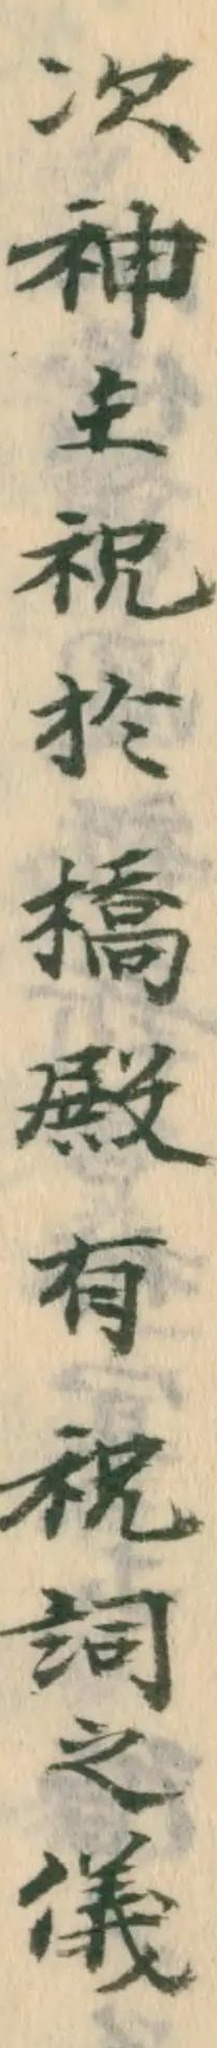次神主祝於橋殿有祝詞之儀
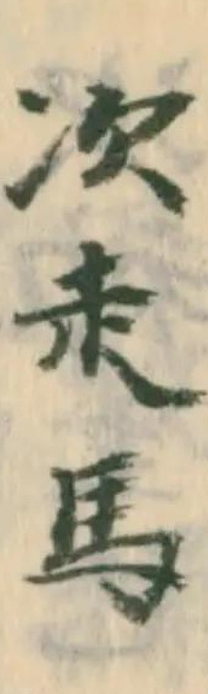次走馬
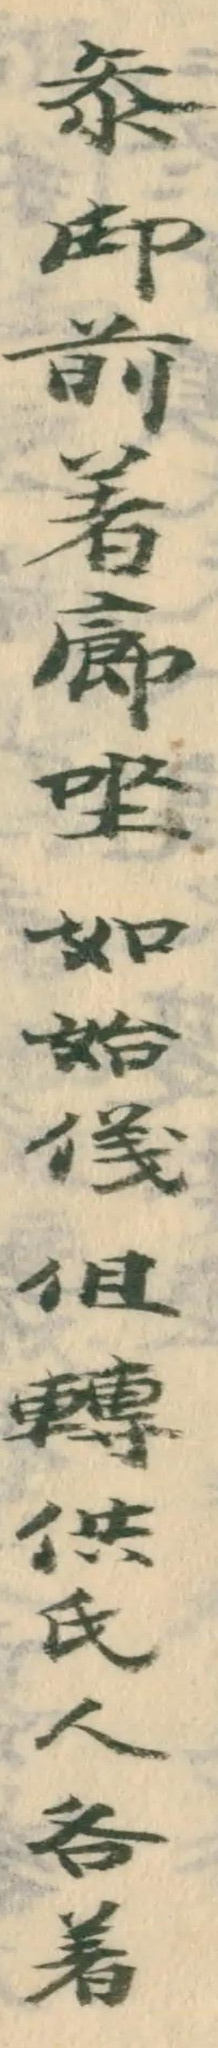参御前着廊坐如始儀但転供氏人各着

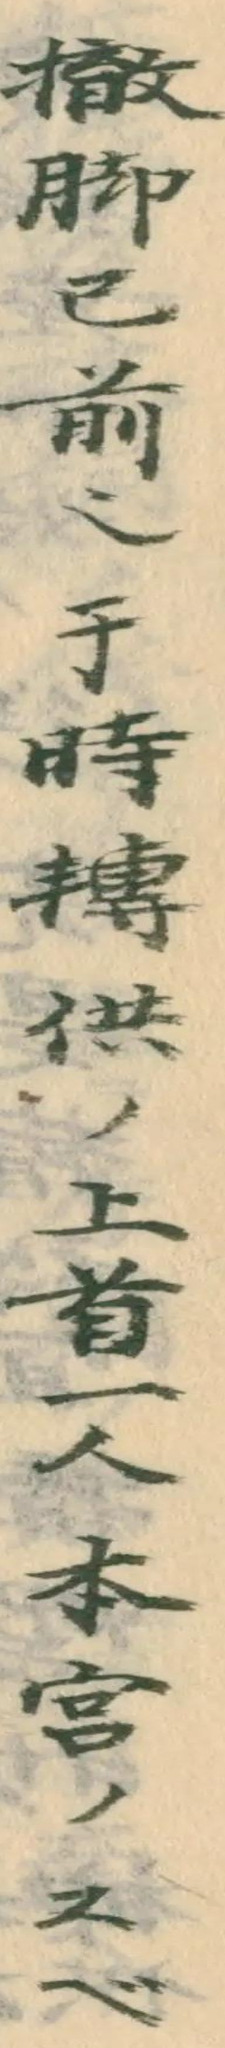撤脚已前也于時転供ノ上首一人本宮ノスベ
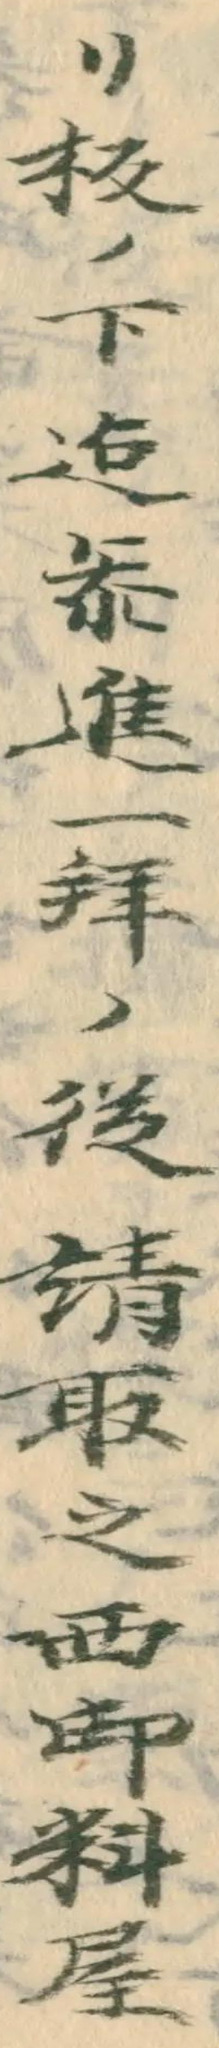リ板ノ下迄参進一拝ノ従請取之西御料屋
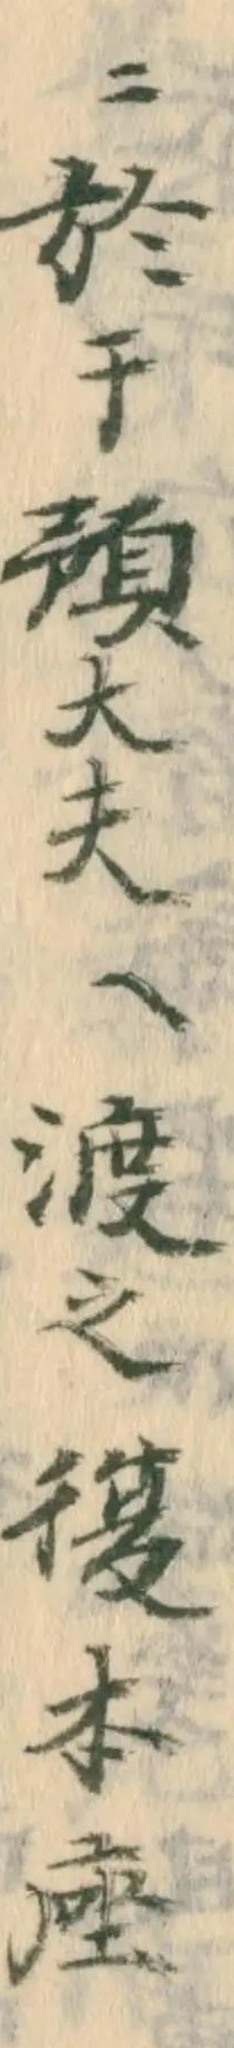ニ於于預大夫ヘ渡之復本座
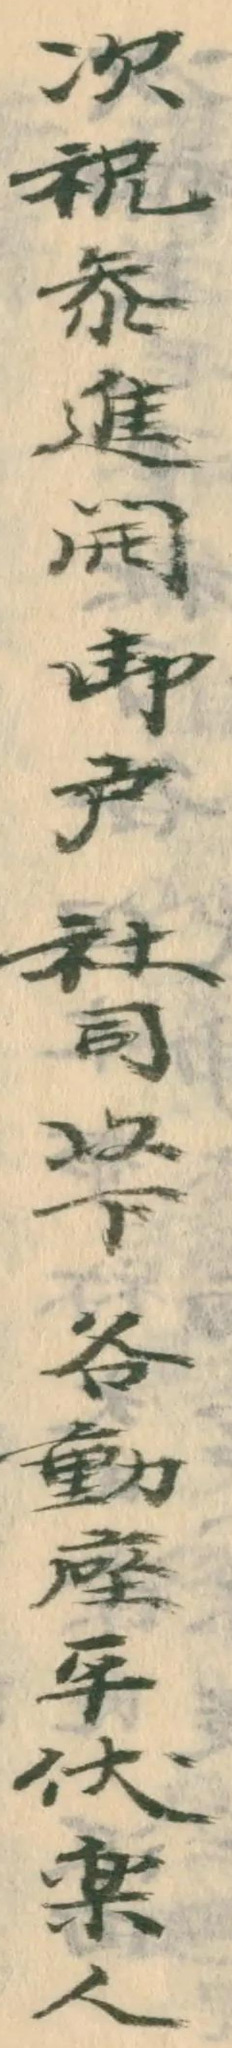次祝参進開御戸社司以下各動座平伏楽人
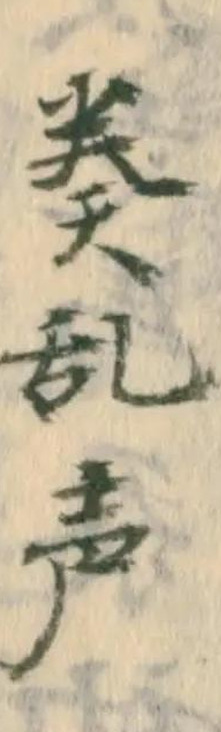奏乱声
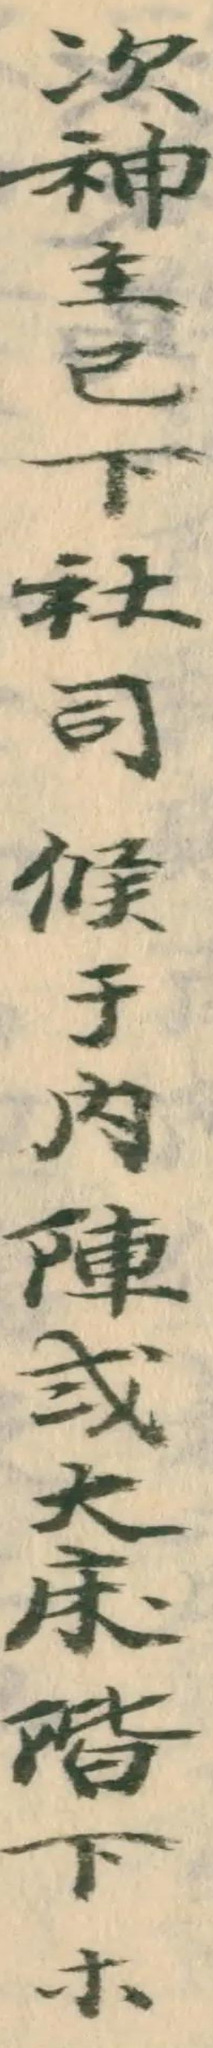次神主已下社司候于内陣或大床階下等
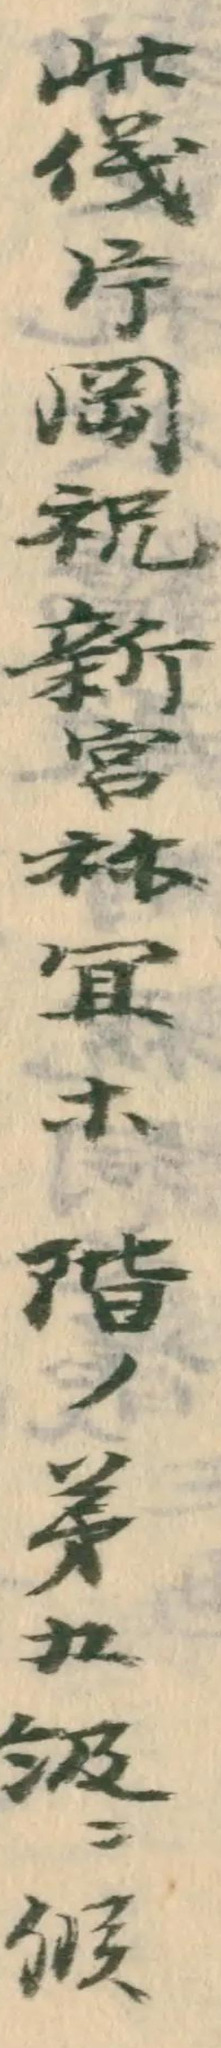此儀片岡祝新宮禰宜等階ノ第五級ニ候
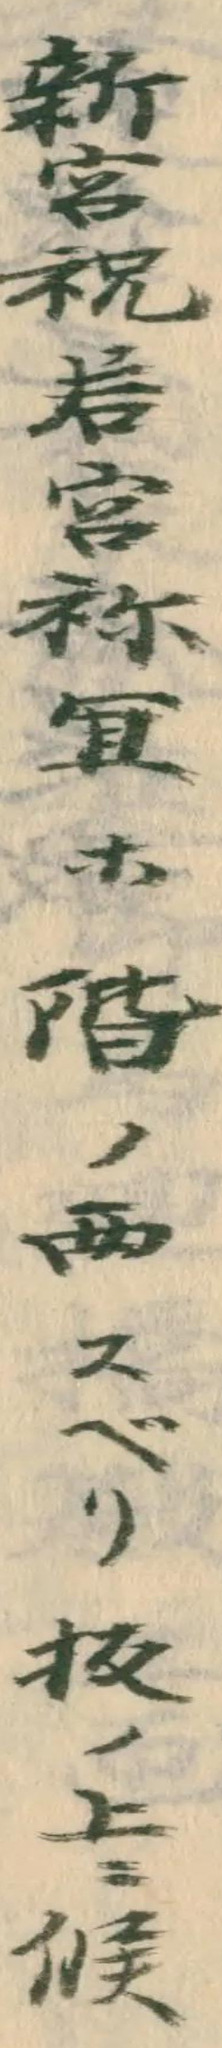新宮祝若宮禰宜等階ノ西スベリ板ノ上ニ候
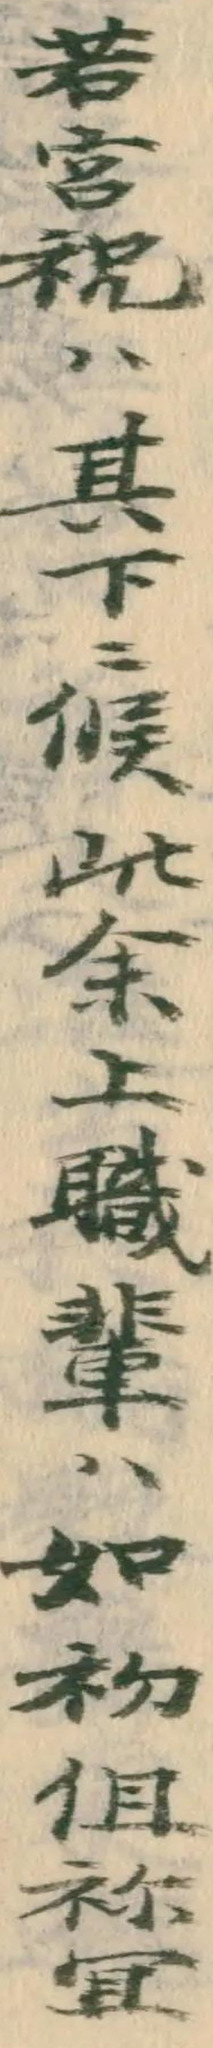若宮祝ハ其下ニ候此余上職輩ハ如初但禰宜
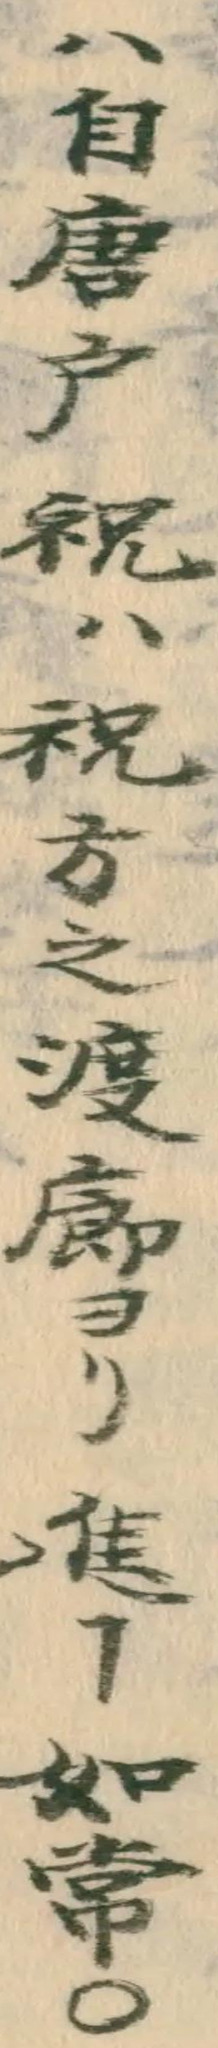ハ自唐戸祝ハ祝方之渡廊ヨリ進コト如常○
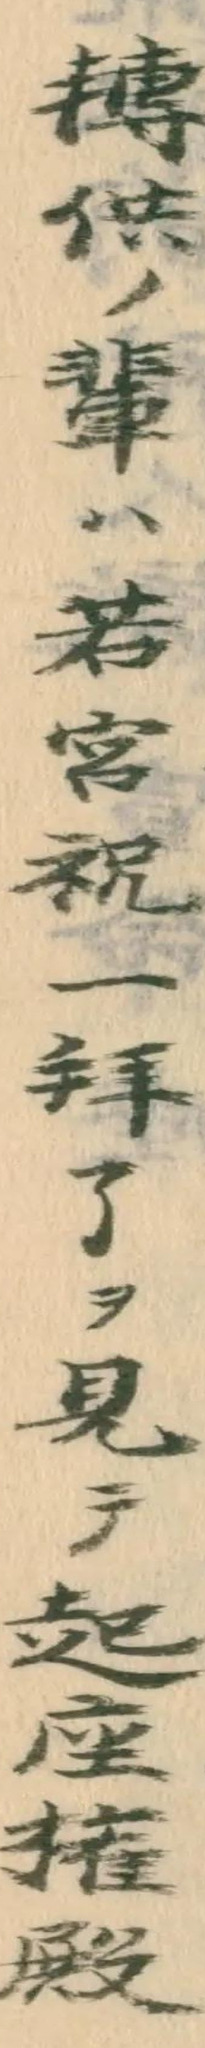転供ノ輩ハ若宮祝一拝了ヲ見テ起座権殿
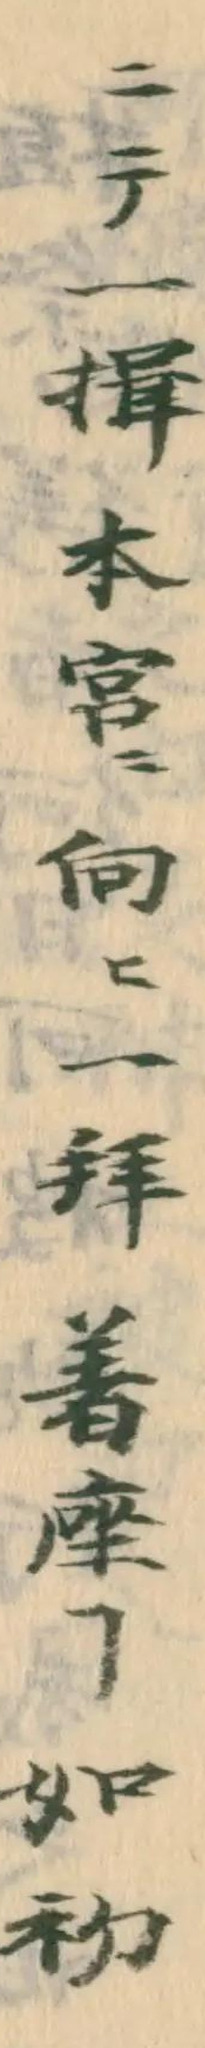ニテ一揖本宮ニ向ヒ一拝着座コト如初
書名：賀茂社記録. 第5冊
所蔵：国立国会図書館 National Diet Library, JAPAN
